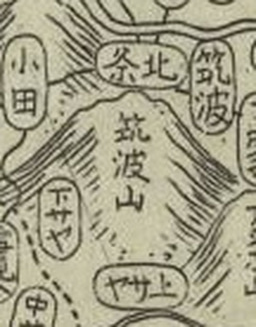筑波郡
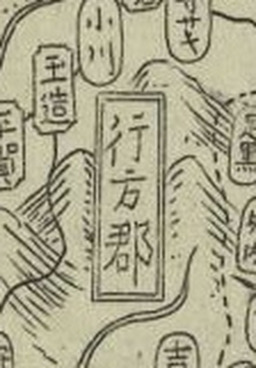行方郡
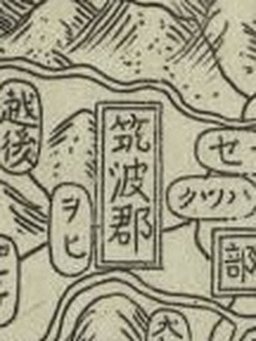筑波郡
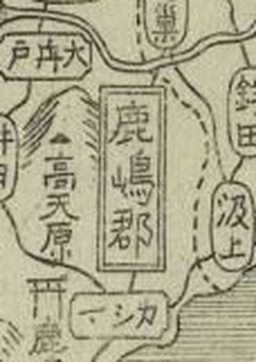鹿嶋郡
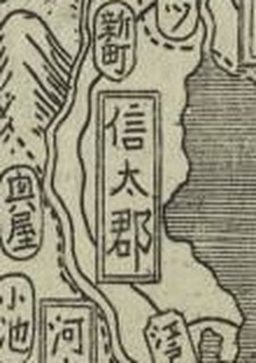信夫郡
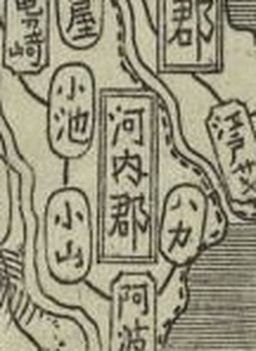河内郡
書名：大日本国細図 東国之部 上
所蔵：University of the Ryukyus Library
